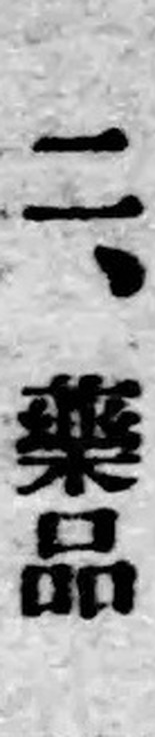二、藥品
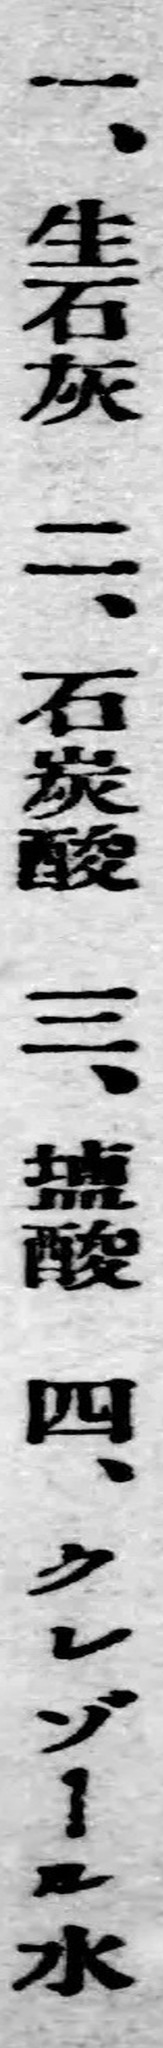一、生石灰二、石炭酸三、䀋酸四、クレゾール水
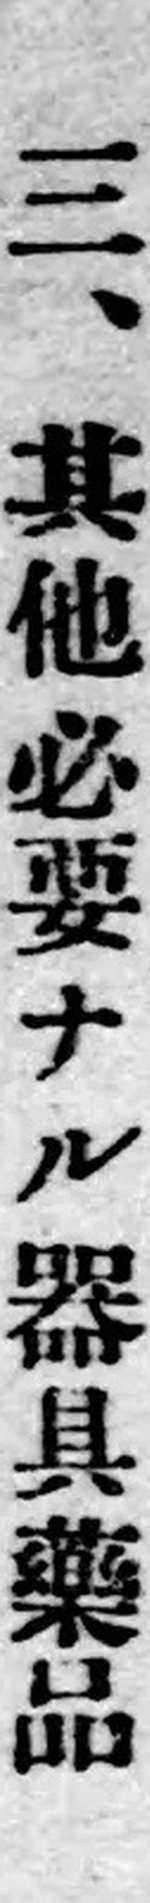三、其他必要ナル器具藥品
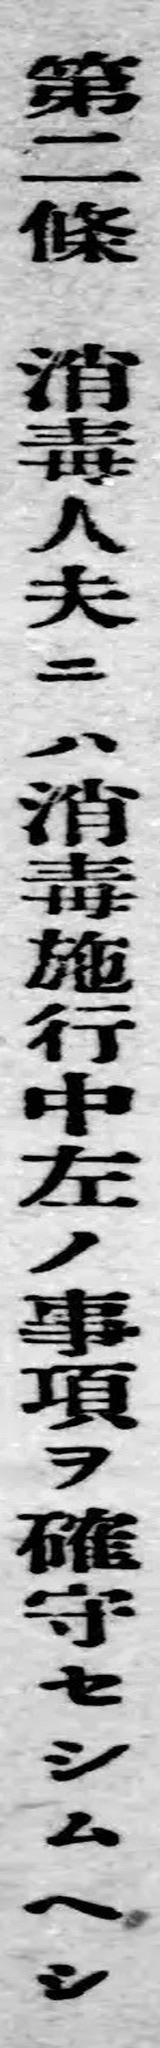第二條消毒人夫ニハ消毒施行中左ノ事項ヲ確守セシムヘシ
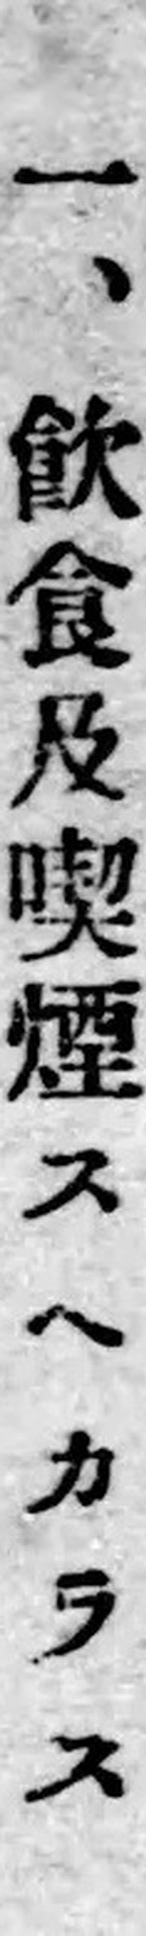一、飮食及喫煙スヘカラス
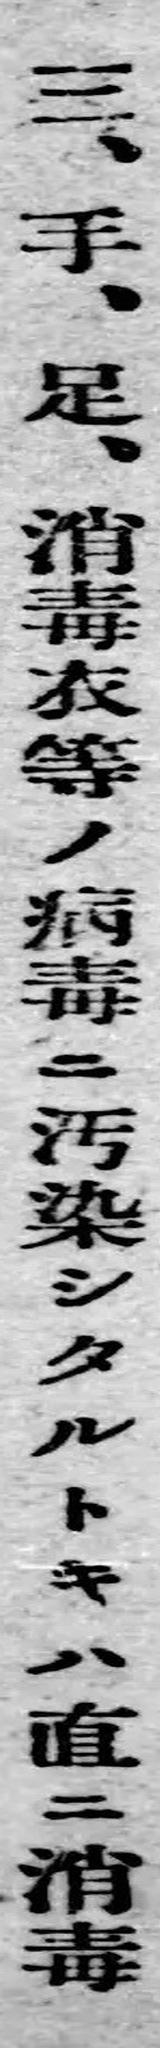三、手、足、消毒衣等ノ病毒ニ汚染シタルトキハ直ニ消毒
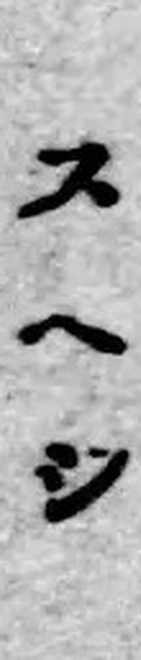スヘシ

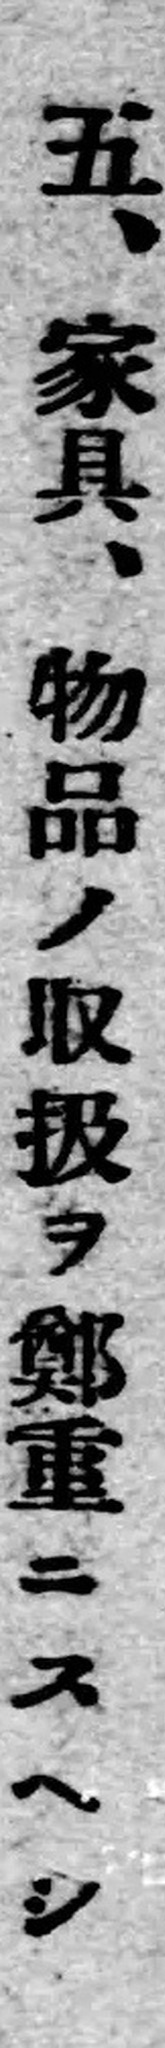五、家具、物品ノ取扱ヲ鄭重ニスヘシ
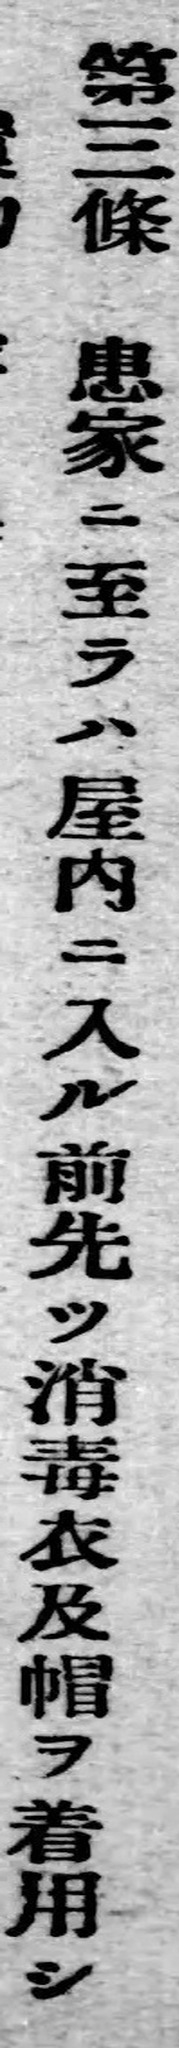第三條患家ニ至ラハ屋内ニ入ル前先ツ消毒衣及帽ヲ着用シ
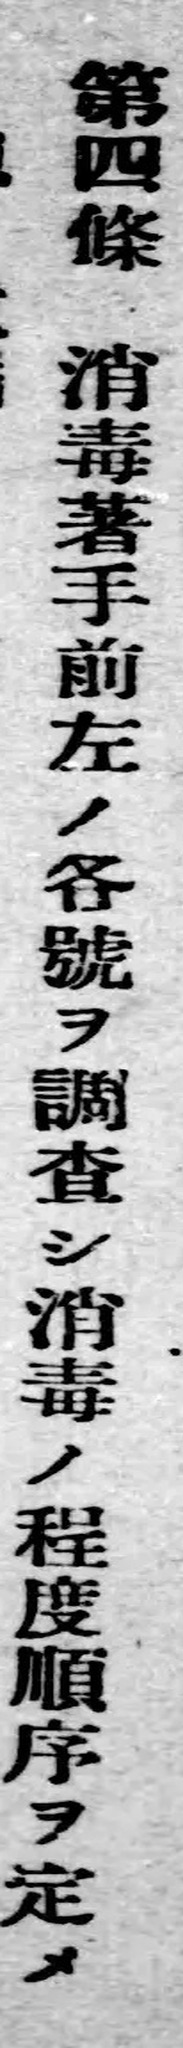第四條消毒著手前左ノ各號ヲ調査シ消毒ノ程度順序ヲ定メ
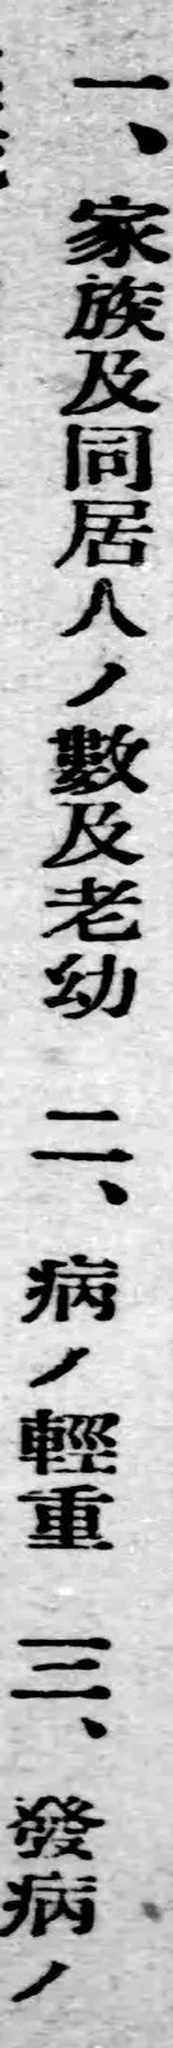一、家族及同居人ノ數及老幼二、病ノ輕重三、發病ノ
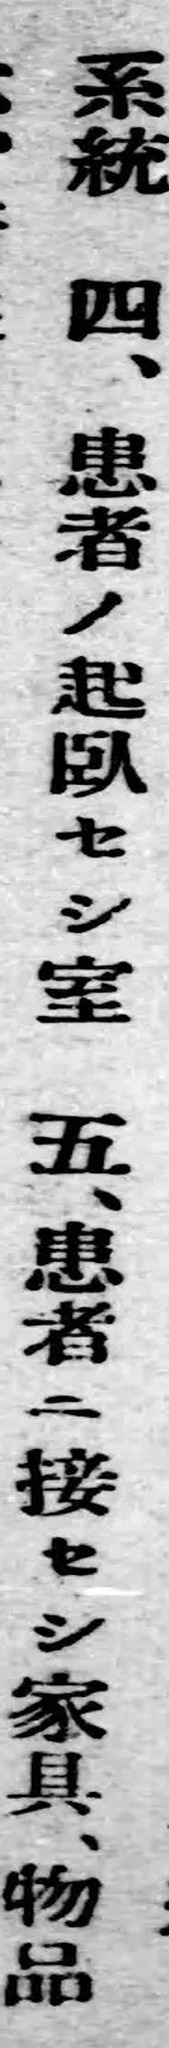系統四、患者ノ起臥セシ室五、患者ニ接セシ家具、物品
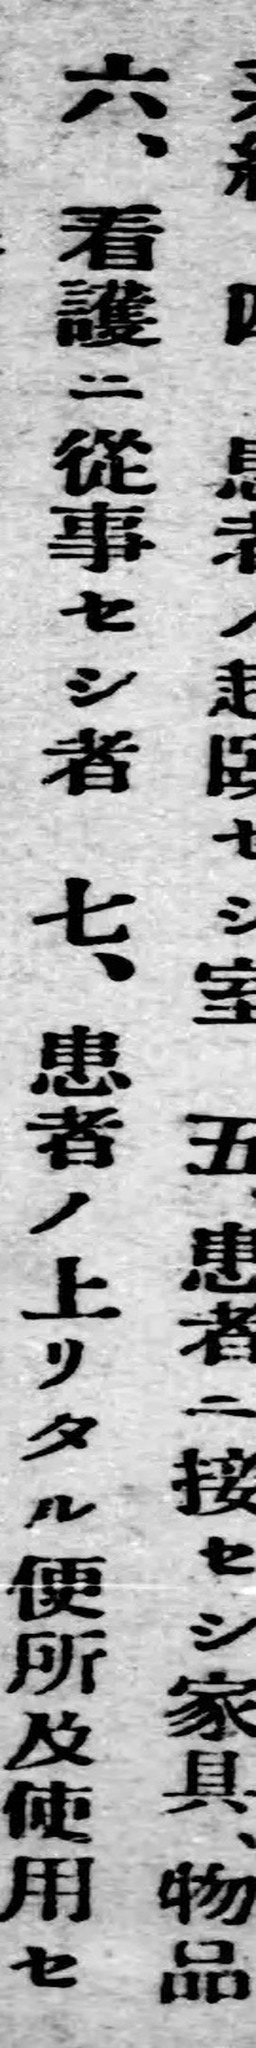六、看護ニ従事セシ者七、患者ノ上リタル便所及使用セ
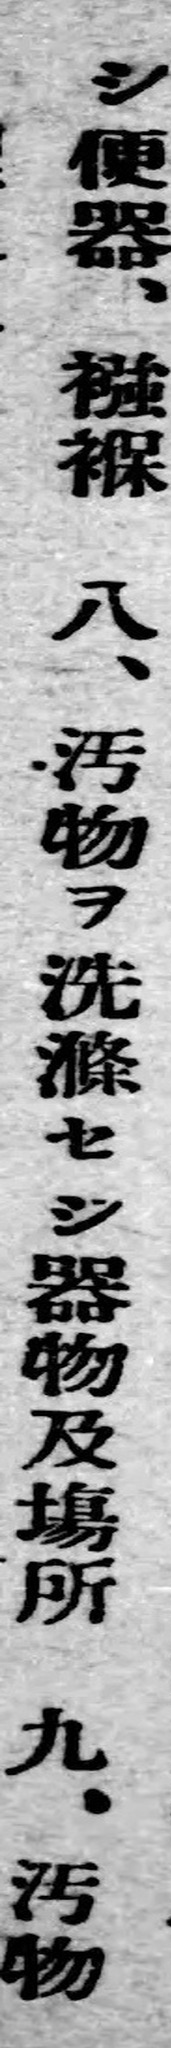シ便器、襁褓八、汚物ヲ洗滌セシ器物及塲所九、汚物
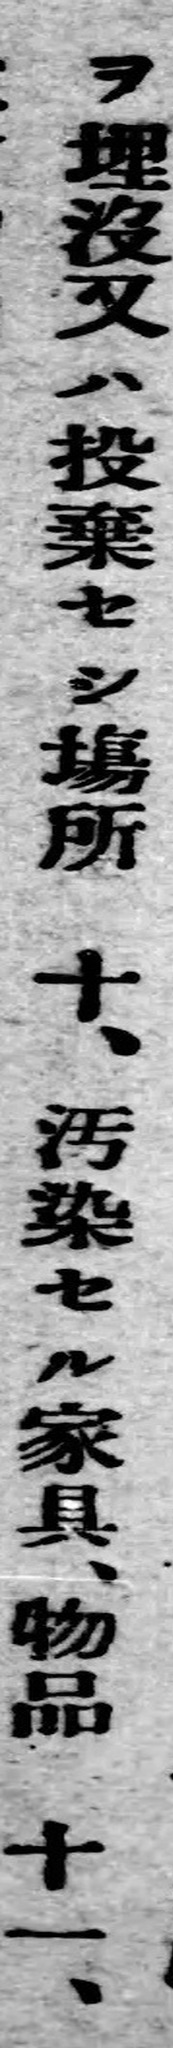ヲ埋沒又ハ投棄セシ塲所十、汚染セル家具、物品十一、
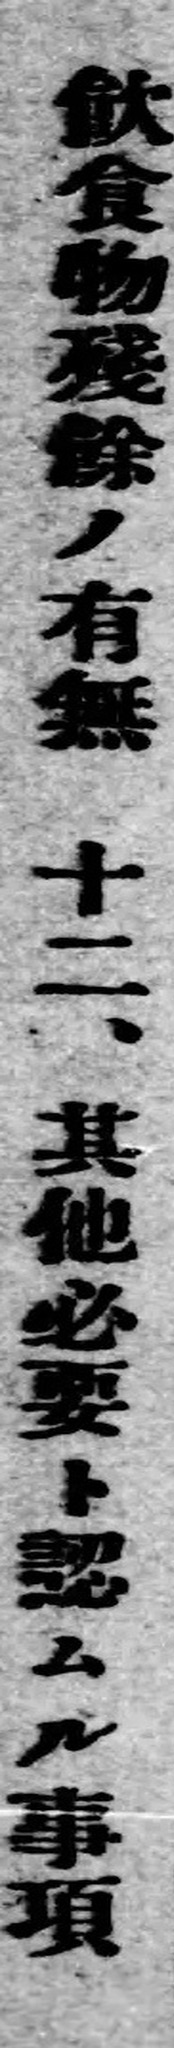飮食物殘餘ノ有無十二、其他必要ト認ムル事項
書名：袖珍防疫必携
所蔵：国立国会図書館 National Diet Library, JAPAN
